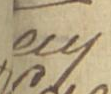-ay
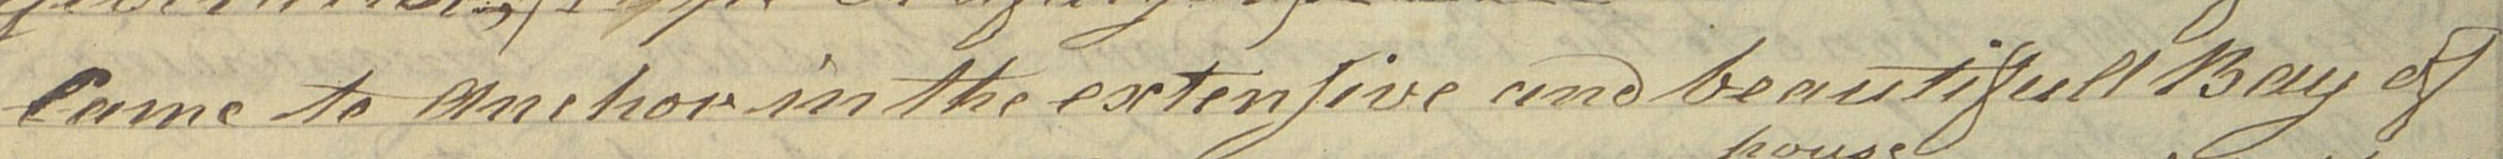came to anchor in the extensive and beautiful Bay of
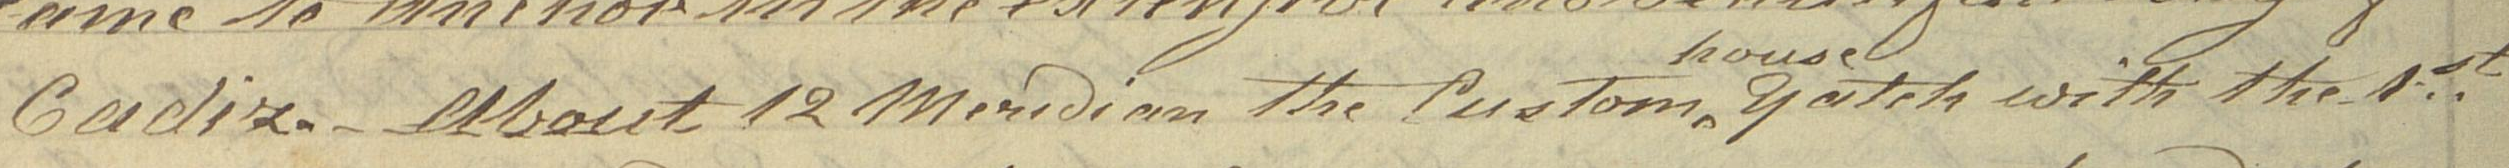Cadiz. About 12 Meridian the Custom ^ Yatch with the 1^st.
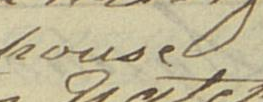house
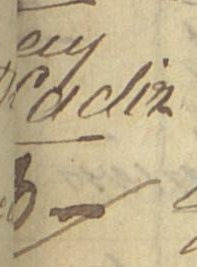Cadiz
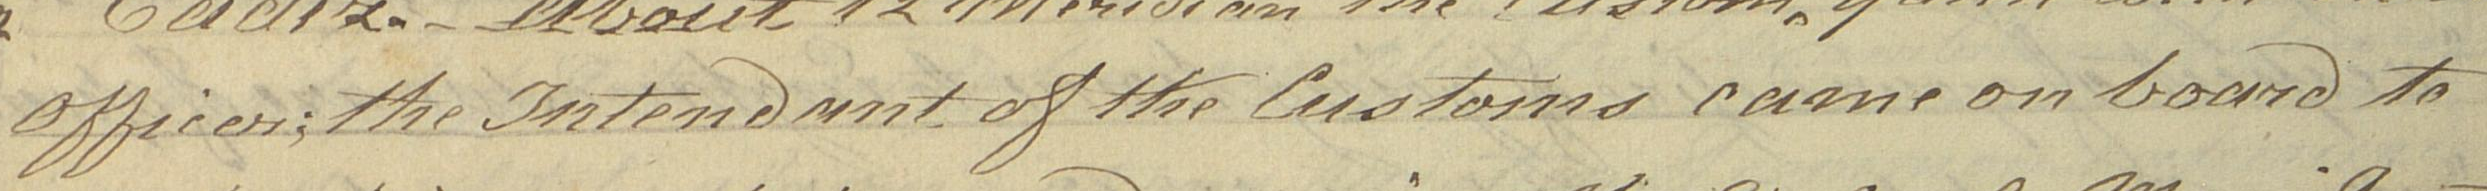Officer; the Intendant of the Customs came on board to
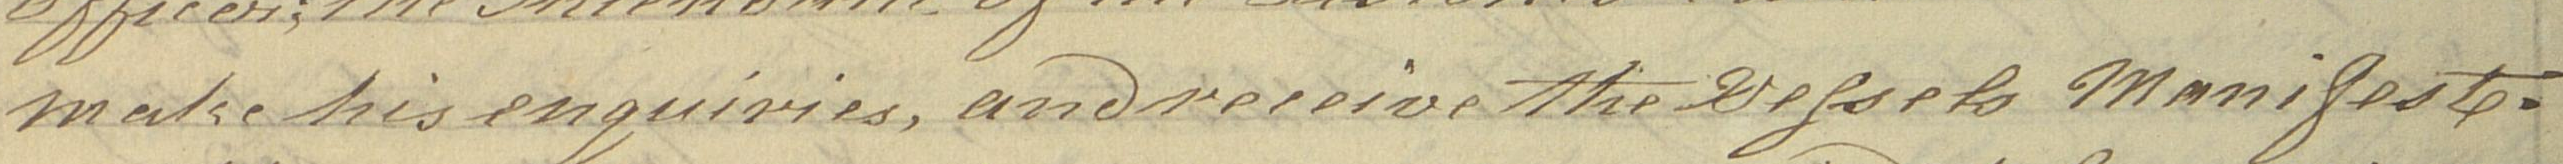make his enquiries, and receive the Vessels Manifest.
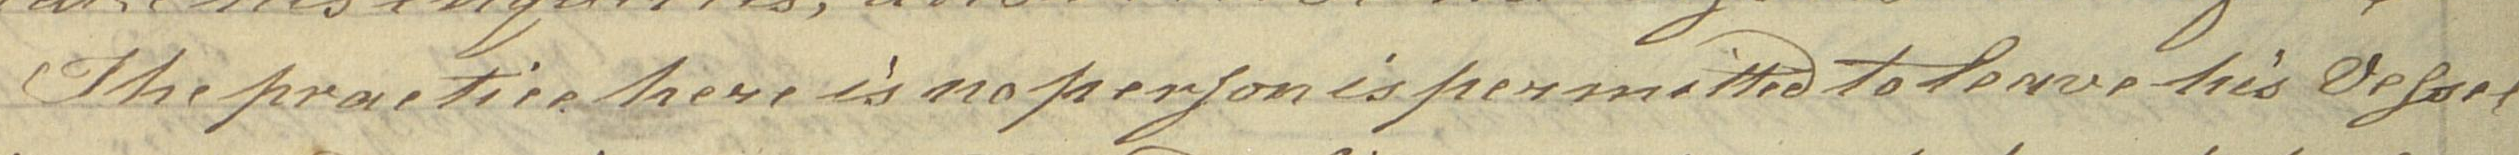The practice here is no person is permitted to leave his Vessel
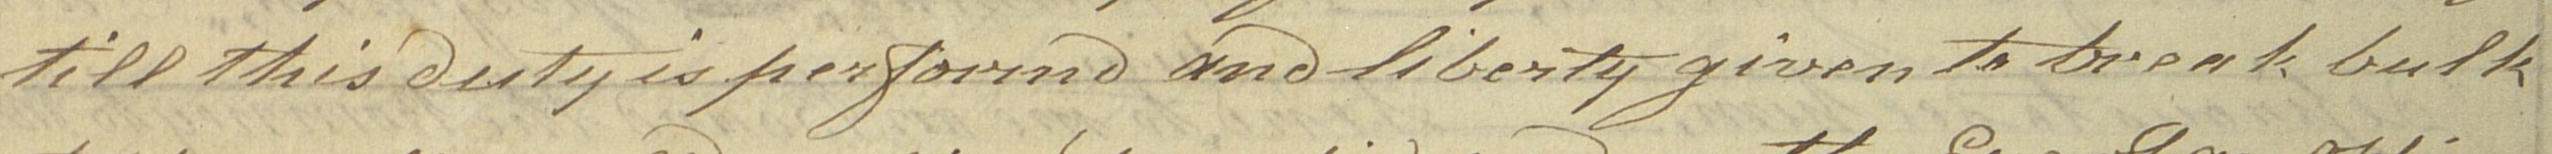till this deity is performd and liberty given to break bulk
